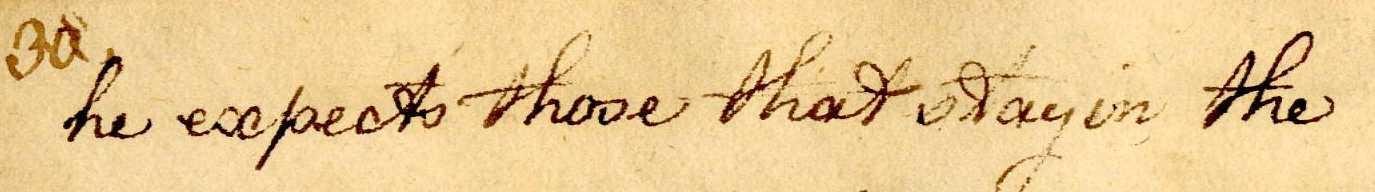he expects those that stay in the
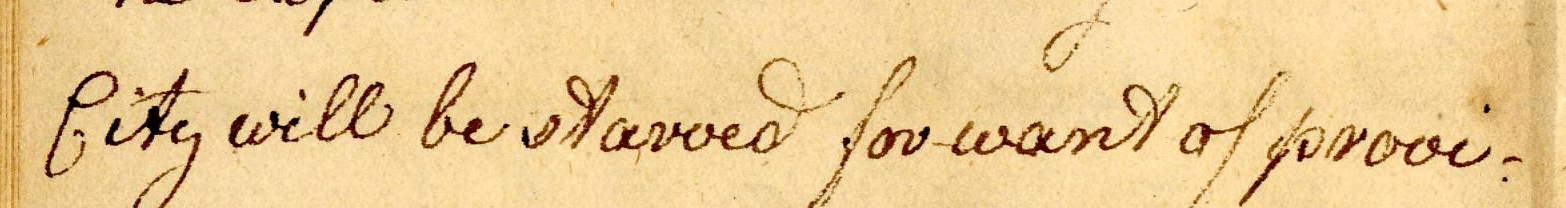City will be starved for want of provi-
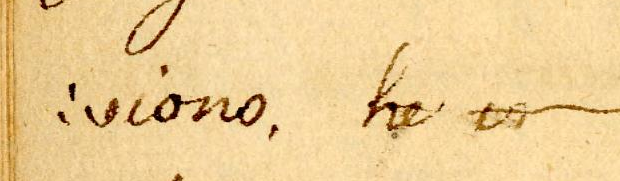-sions, [he is]
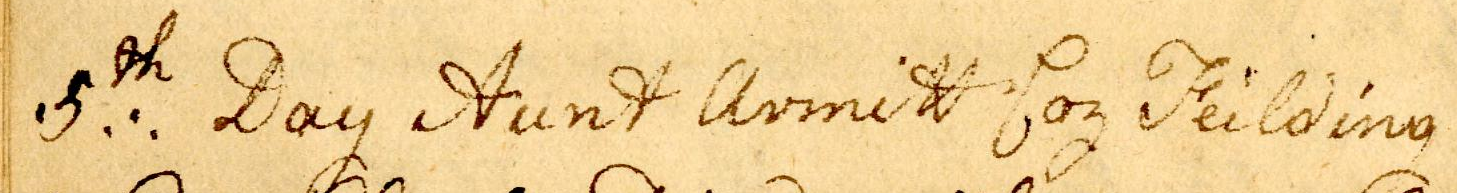5^th Day Aunt Armitt Coz Feilding
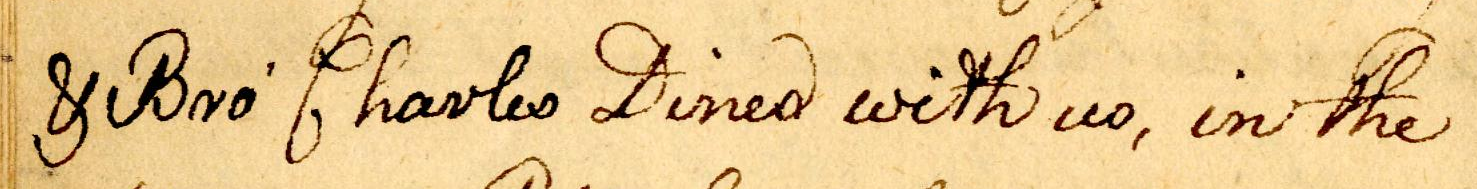& Bro' Charles Dined with us, in the
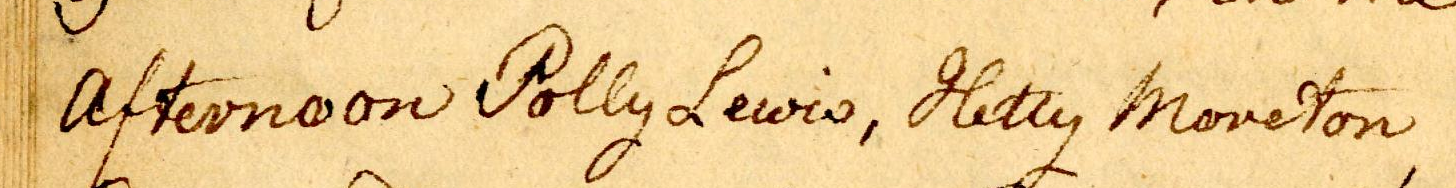Afternoon Polly Lewis, Hetty Moreton,
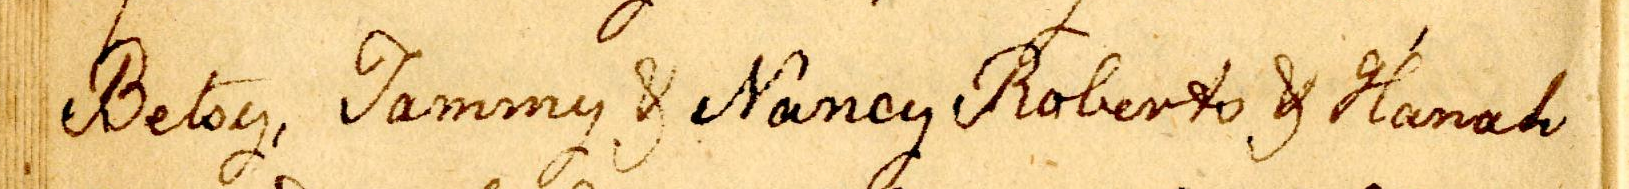Betsy, Tammy & Nancy Roberts & Hannah
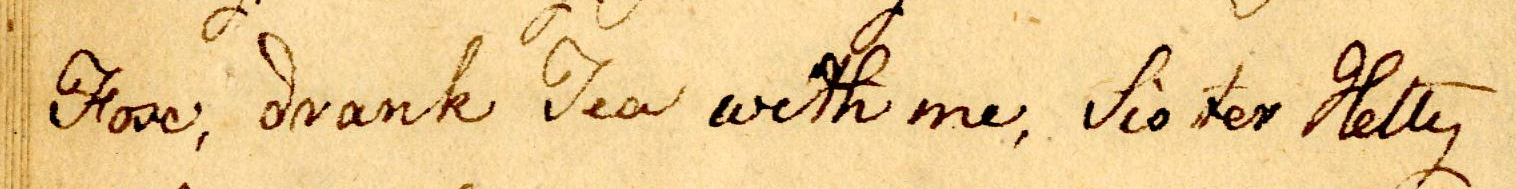Fox, drank Tea with me, Sister Hetty
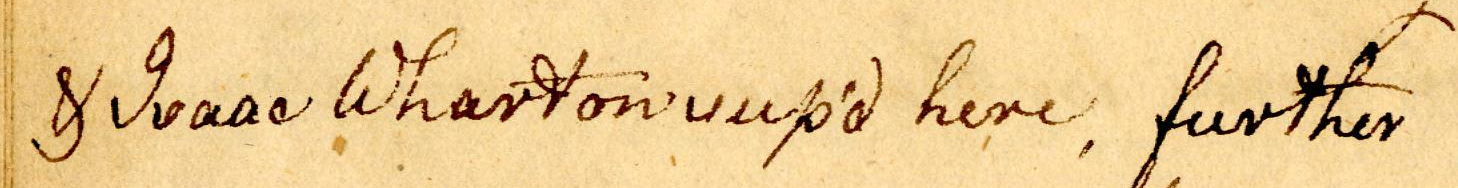& Isaac Wharton sup'd here, further
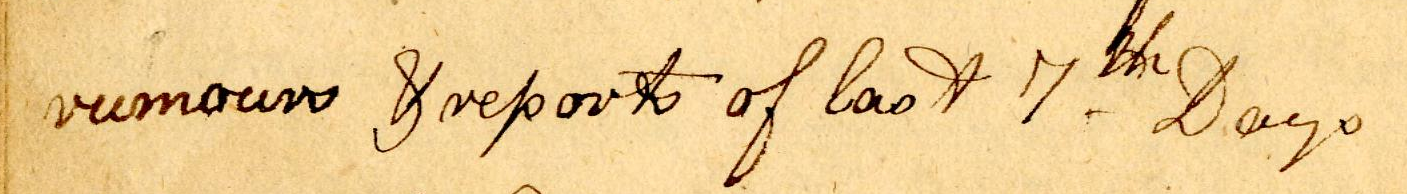rumours & reports of last 7^th Days
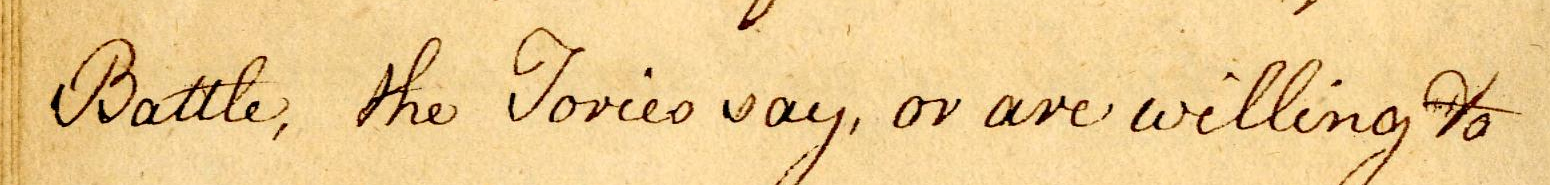Battle, the Tories say, or are willing to
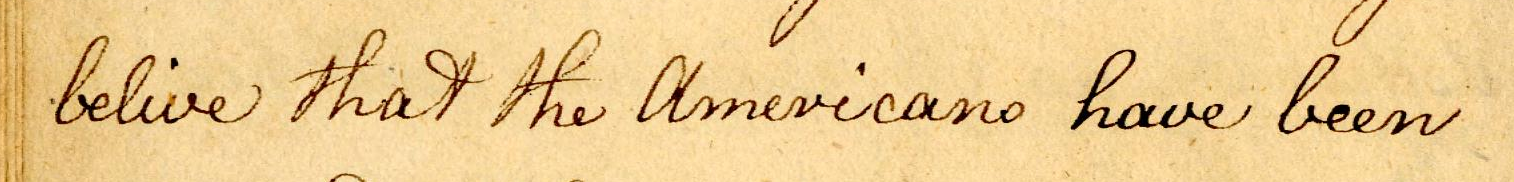belive that the Americans have been
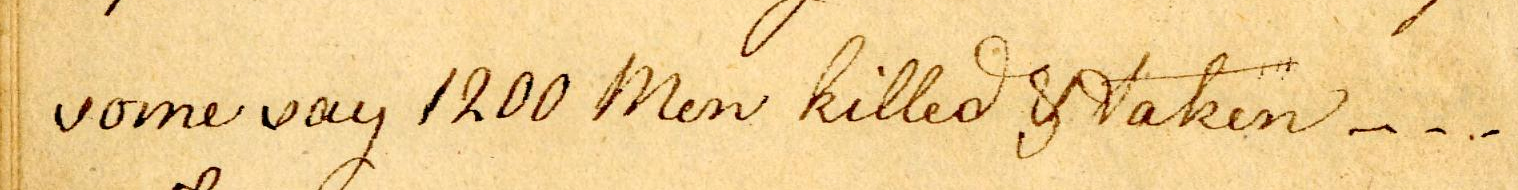some say 1200 Men killed & taken -
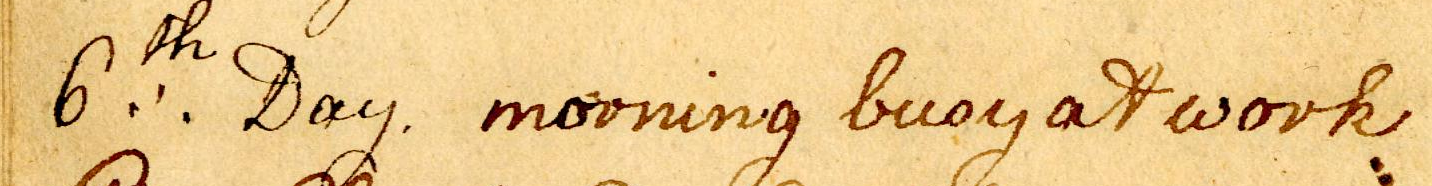6^th Day. morning busy at work
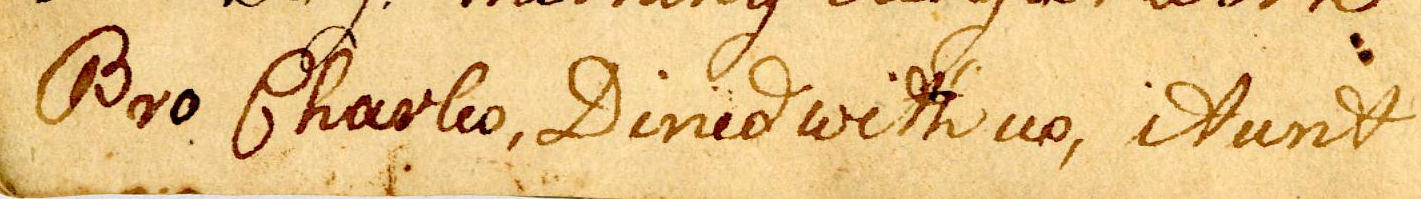Bro Charles, Dined with us, Aunt
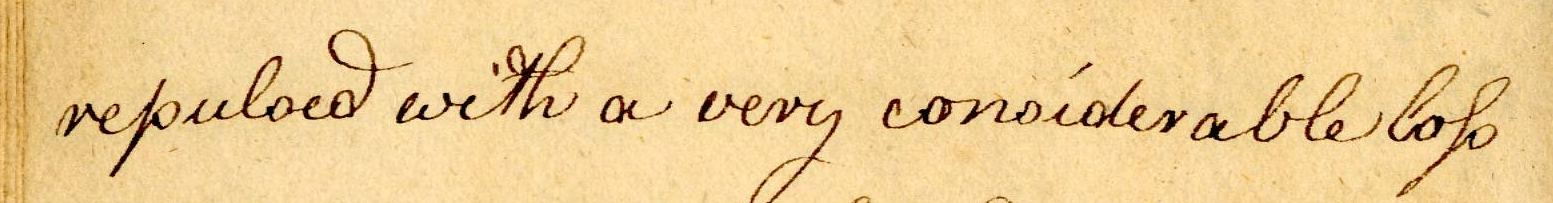repulsed with a very considerable loss
